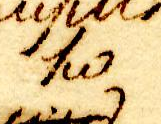he
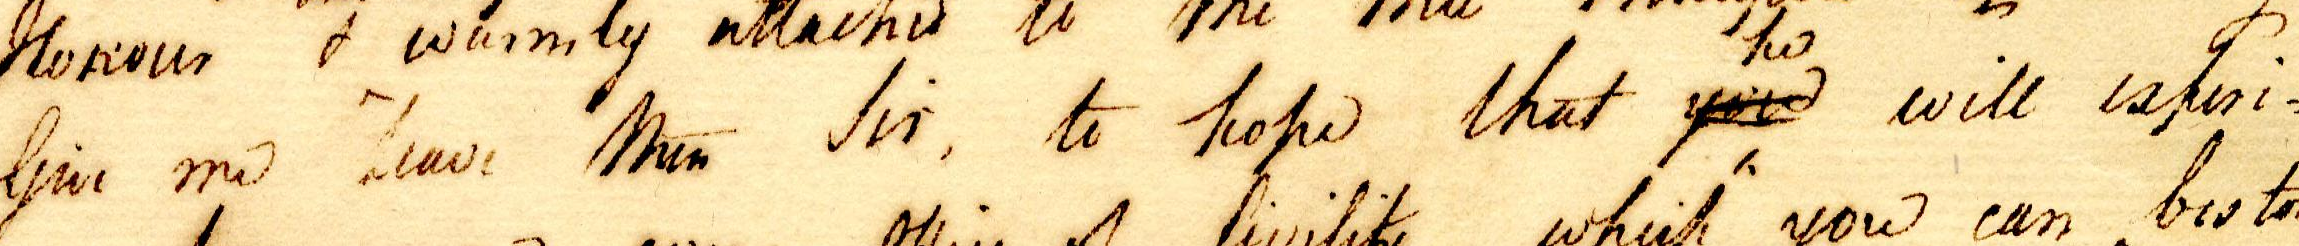Give me Leave then Sir, to hope that you ^ will experi-
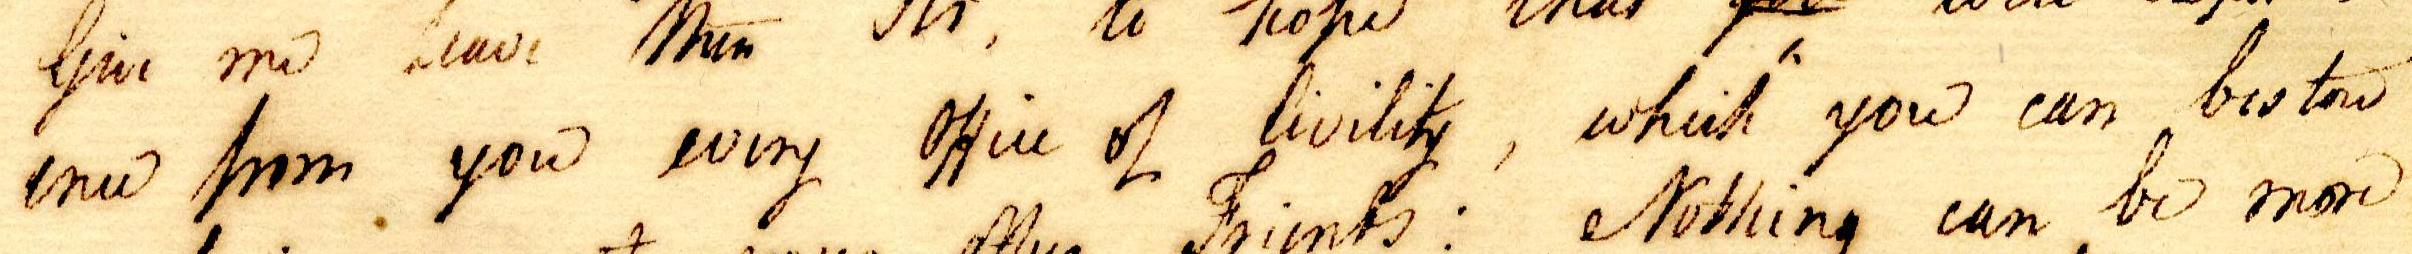-ence from you every office of Civility, which you can bestow
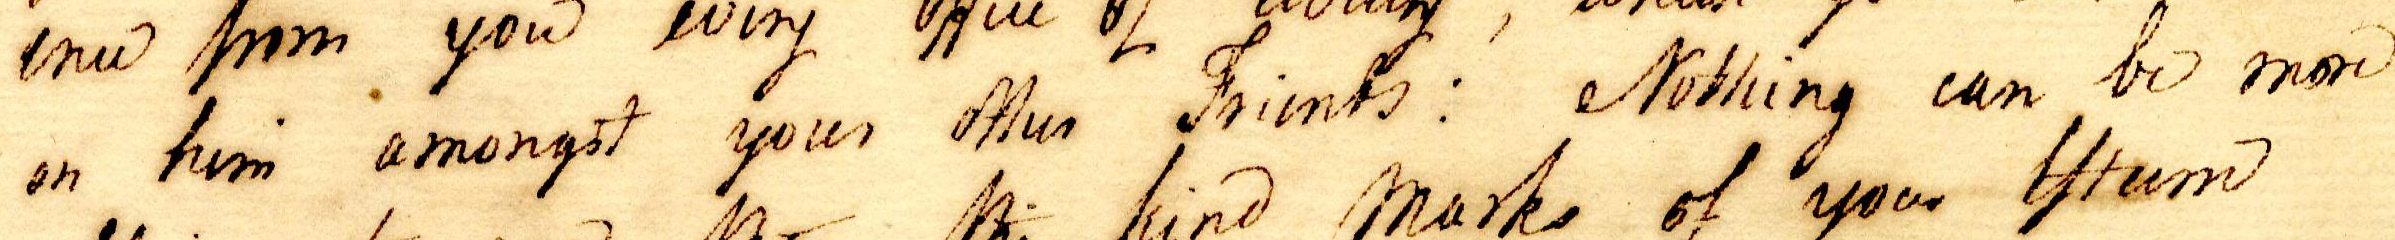on him amongst your other Friends: Nothing can be more
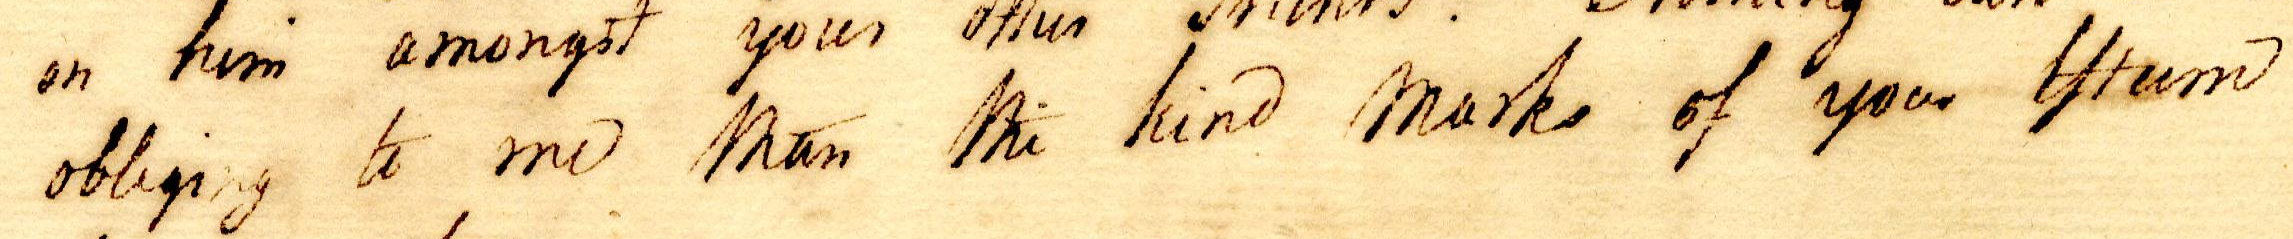obliging to me than the kind marks of your Esteem
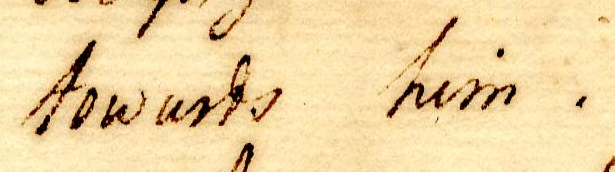towards him.
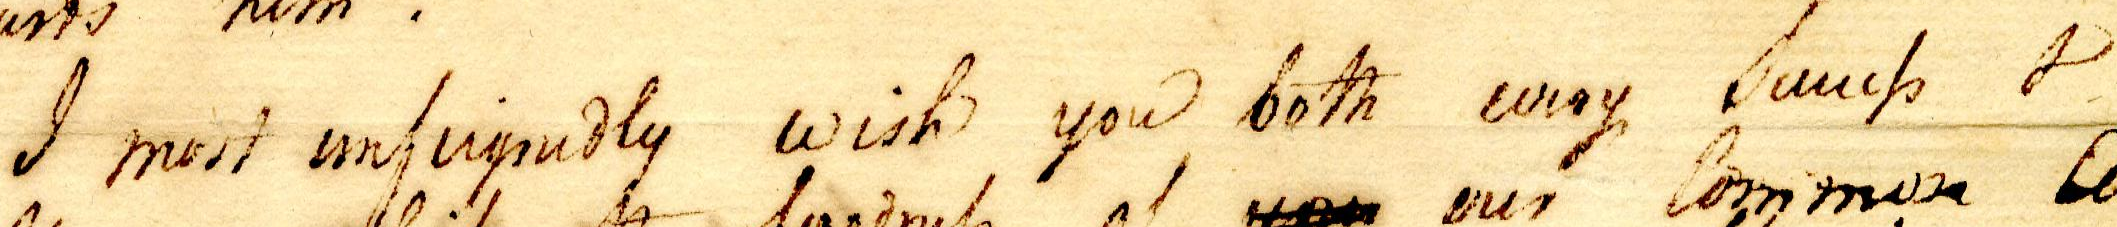I most unfeignedly wish you both every Success &
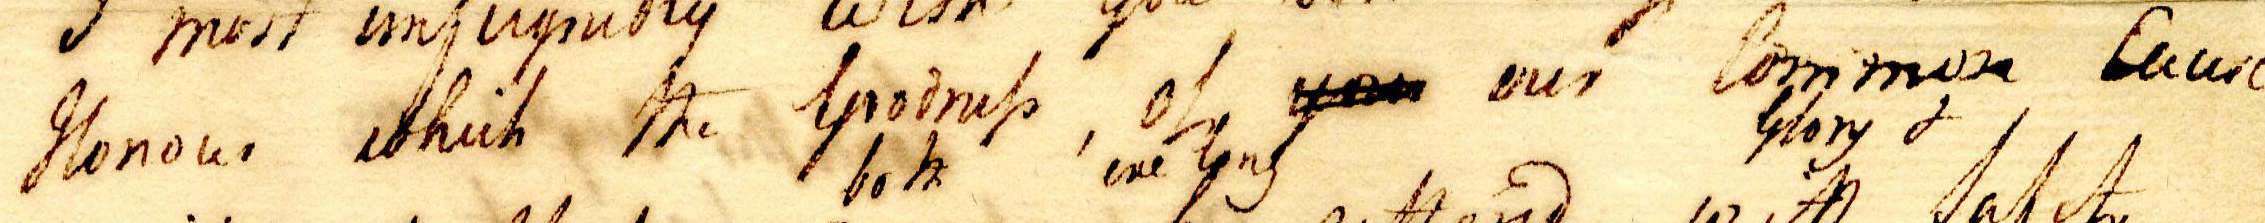Honour which the Goodness, of you our Common Cause
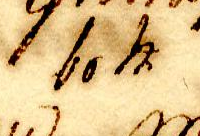both
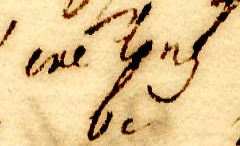ere long
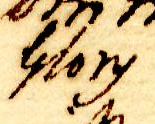Glory &
